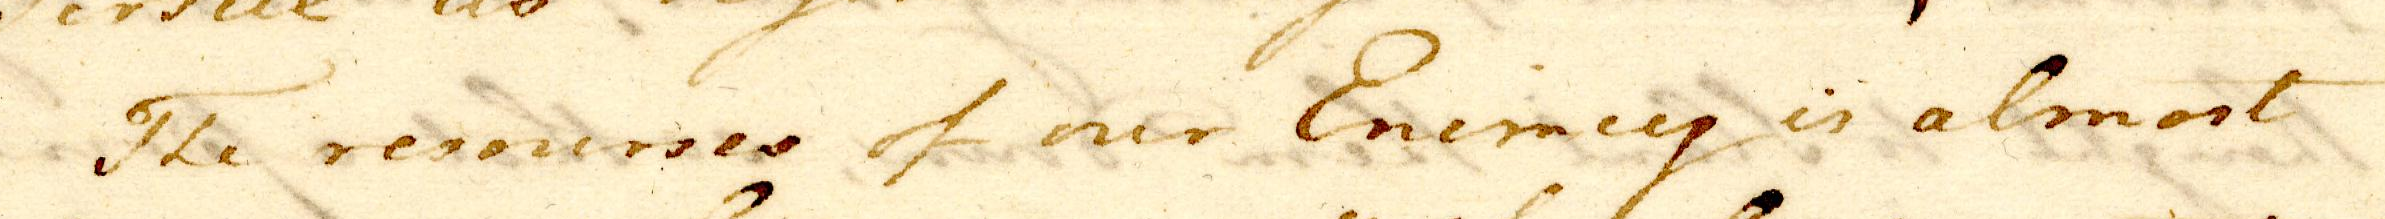The resources of our Enemy is almost
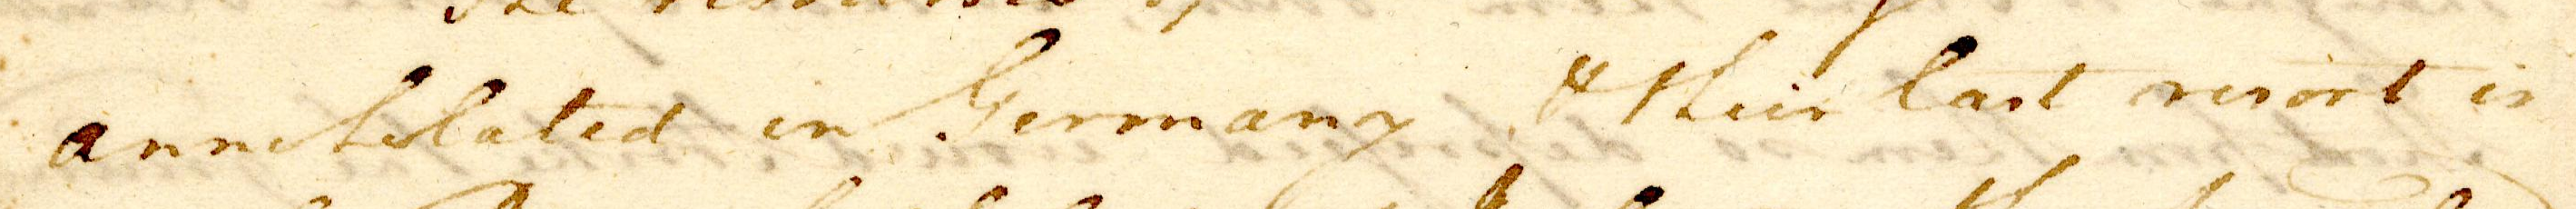annihilated in Germany & their last resort is
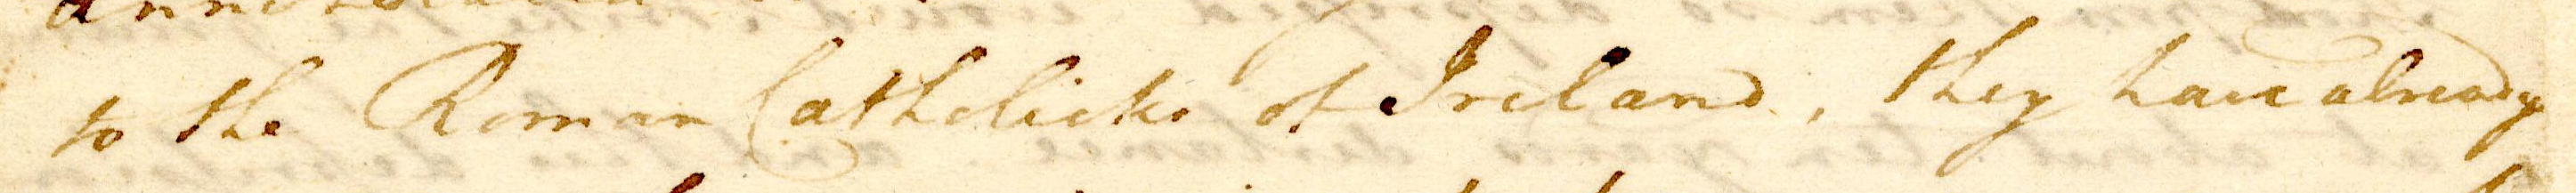to the Roman Catholicks of Ireland, they have already
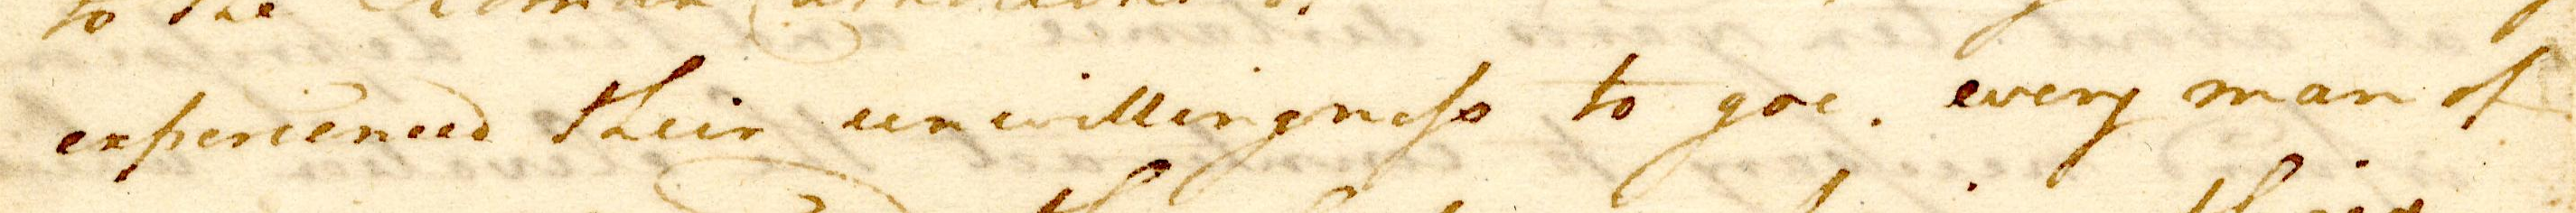experienced their unwillingness to goe, every man of
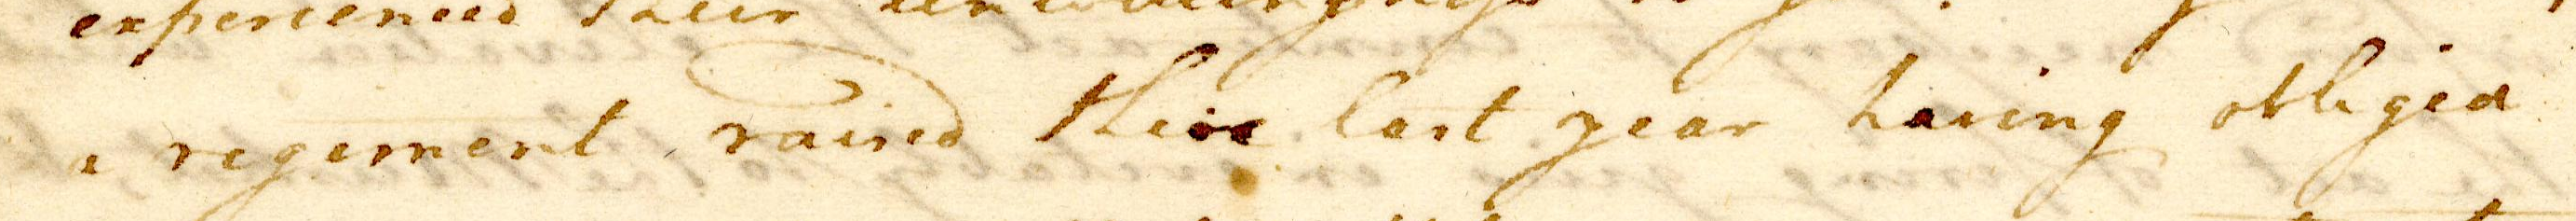a regiment raised these last year having obliged
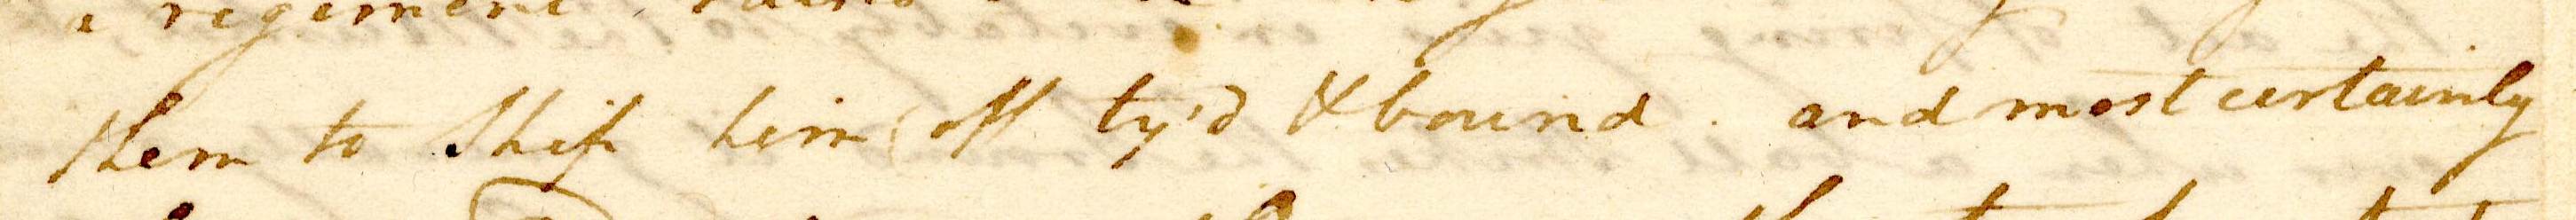them to Ship him off ty'd & bound. and most certainly
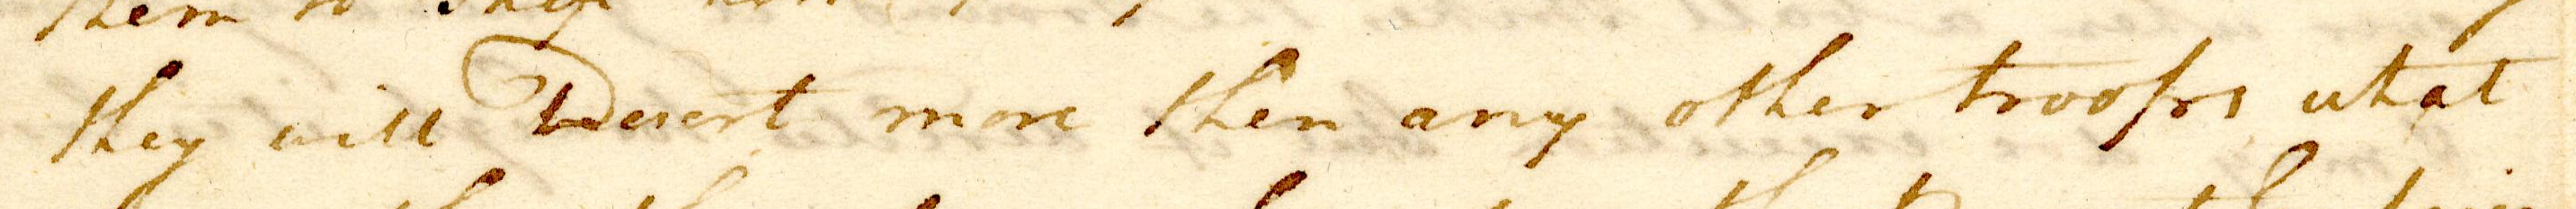they will Desert more then any other troops what
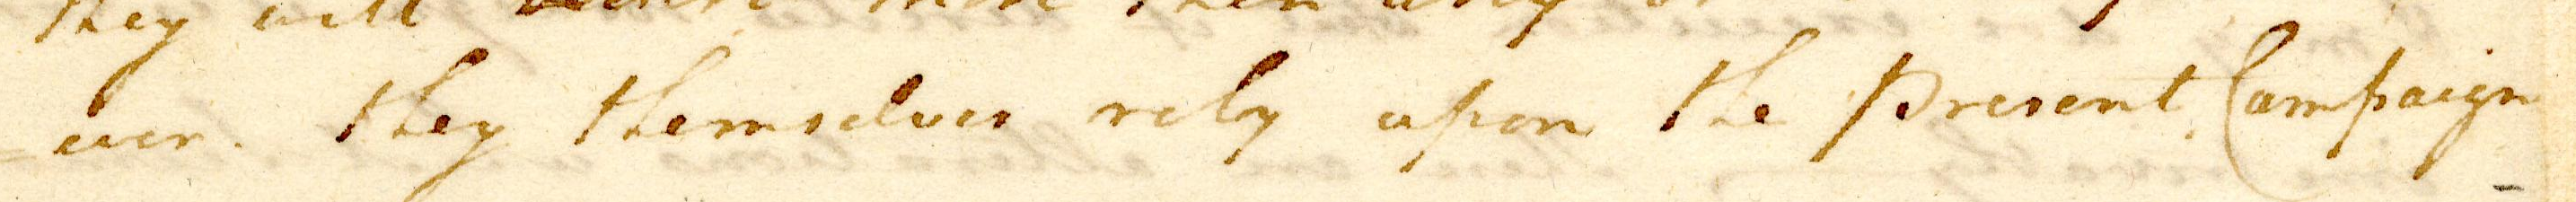ever they themselves rely upon the Present Campaign
